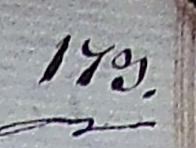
173.
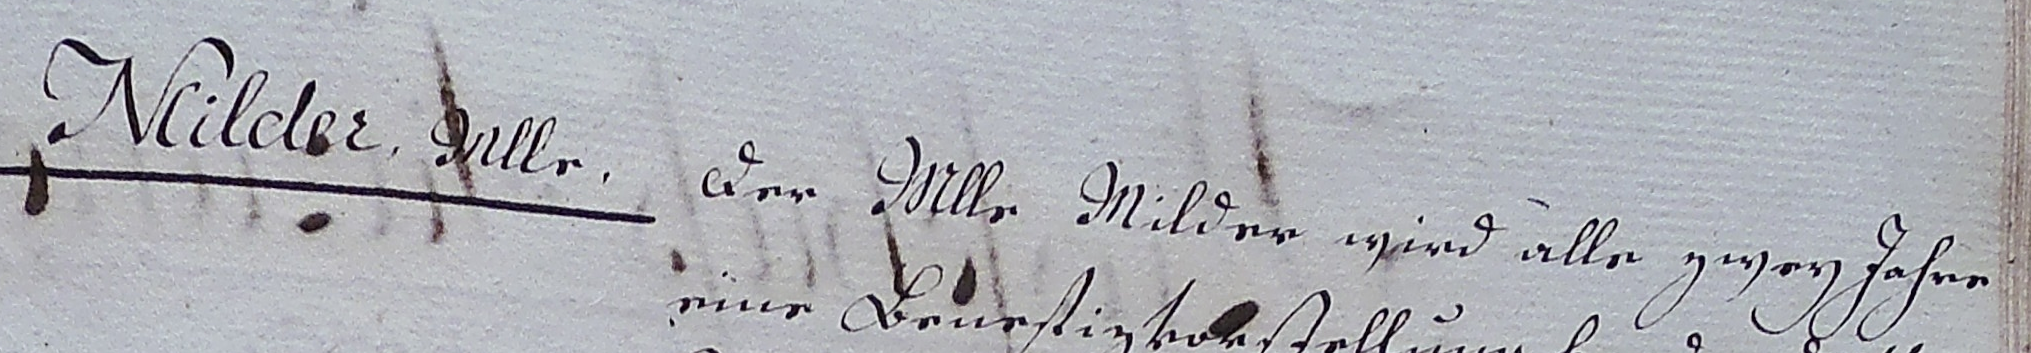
Milder, Mlle. Der Mlle Milder wird alle zwey Jahre
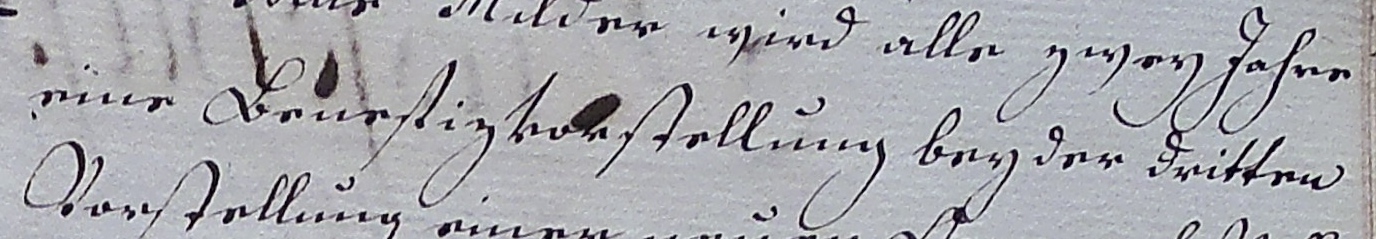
eine Benefizvorstellung bey der dritten
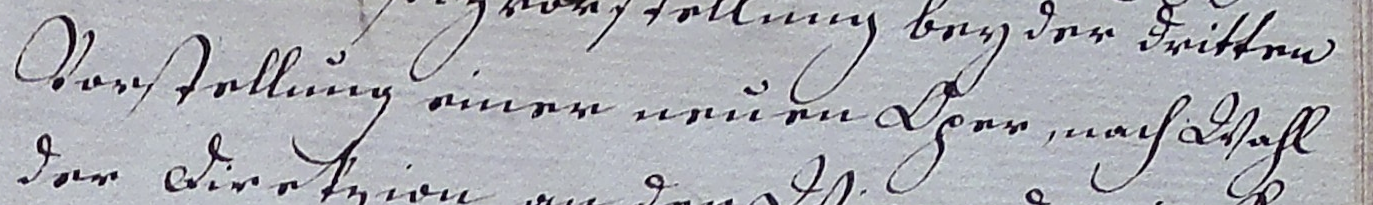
Vorstellung einer neuen Oper nach Wahl
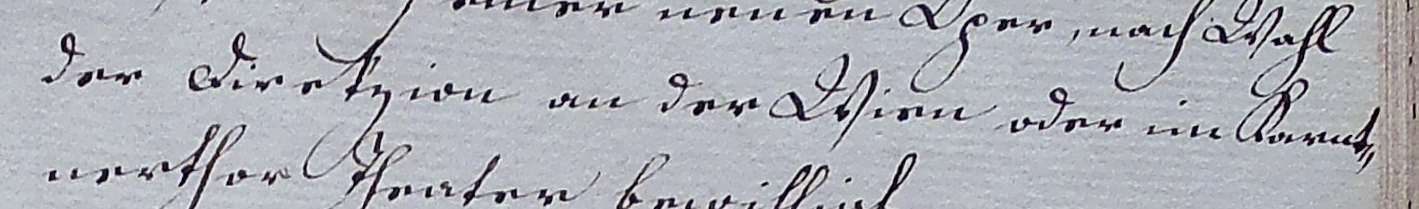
der Direkzion an der Wien oder im Karnt¬
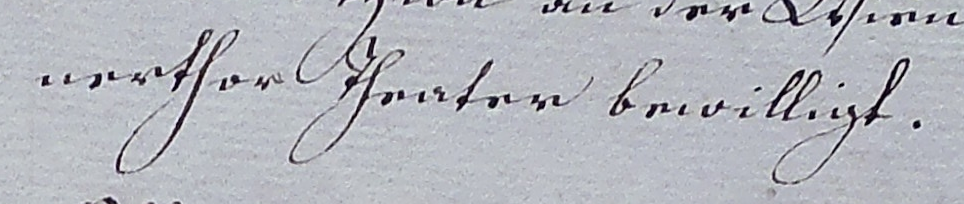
nerthor Theater bewilligt.
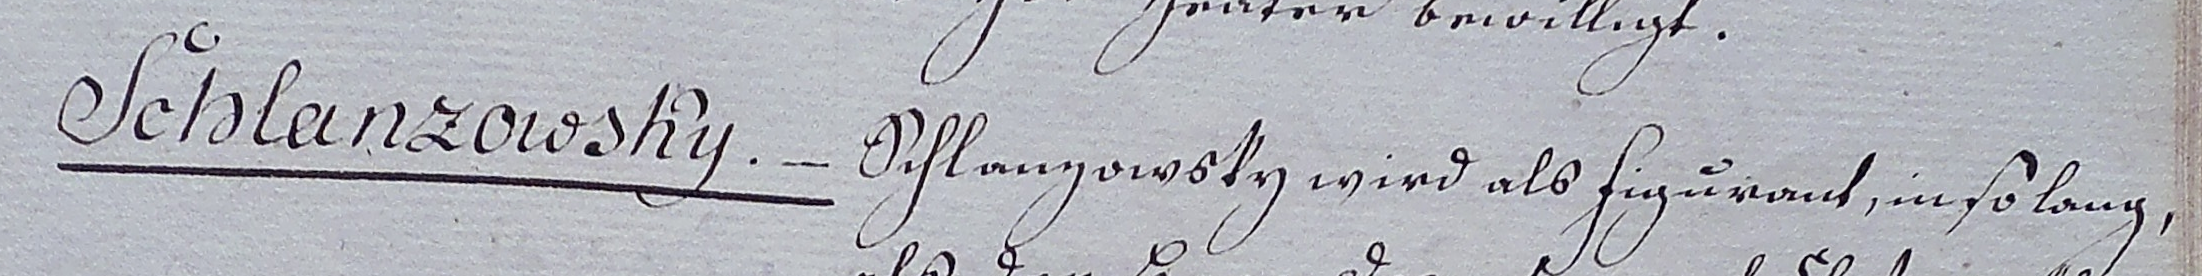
Schlanzowsky. _ Schlanzowsky wird als Figurant, in solang,
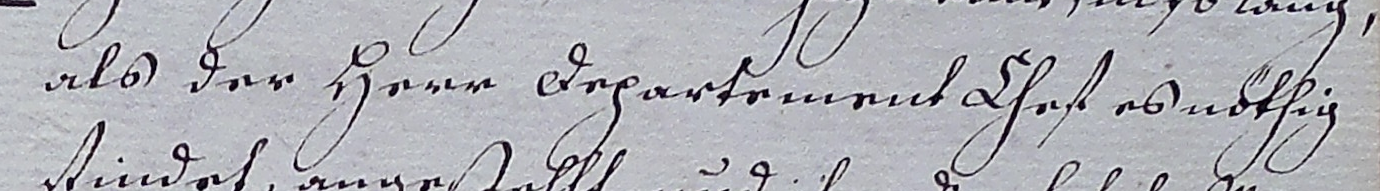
als der Herr Departement Chef es nöthig
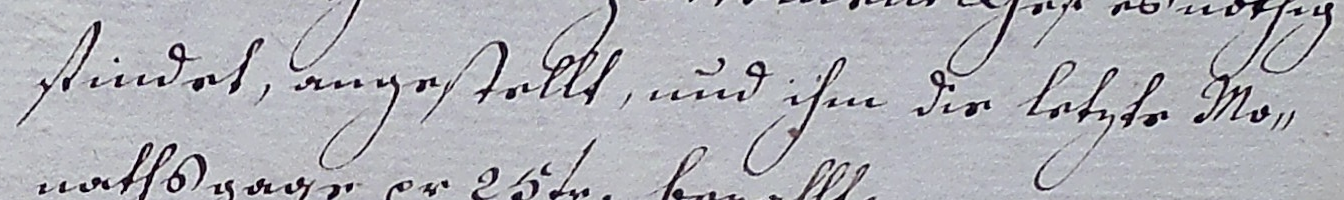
findet, angestellt, und ihm die letzte Mo¬
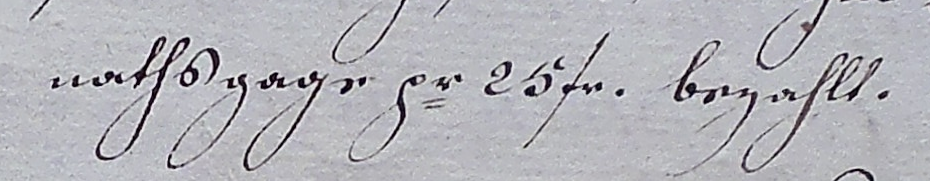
nathsgage pr͇ 25fr. bezahlt.
